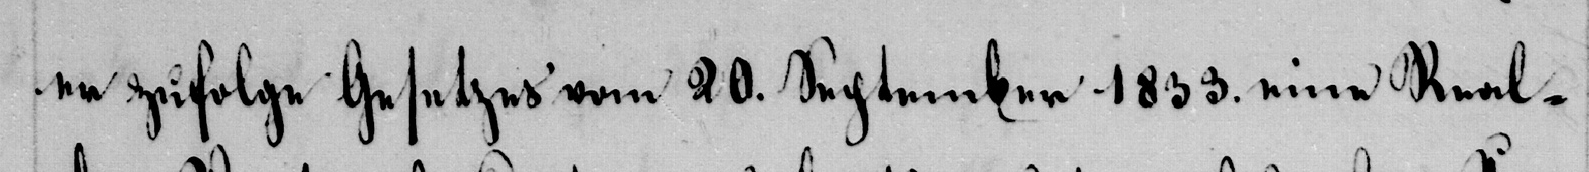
er zufolge Gesetzes vom 20. September 1833. eine Real-
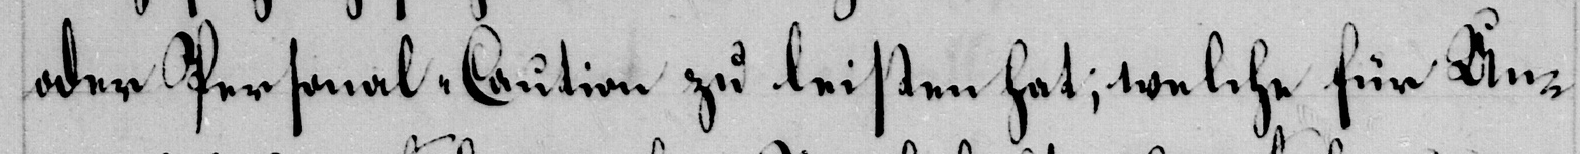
oder Personal-Caution zu leisten hat; welche für Un¬
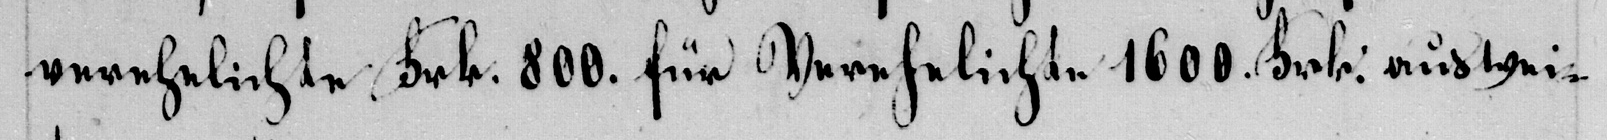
verehelichte Frk. 800. für Verehelichte 1600. Frk. auswei¬
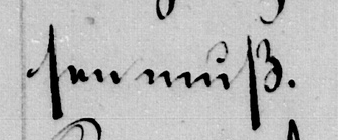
sen muß.
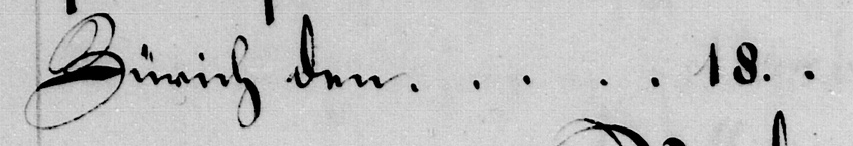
Zürich, den ...18..
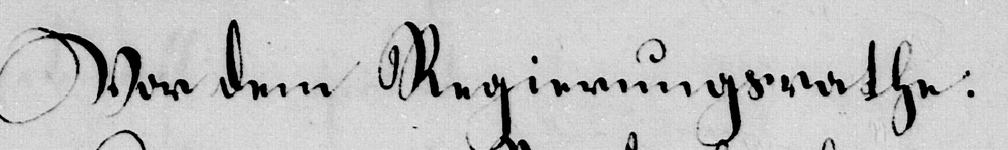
Vor dem Regierungsrathe:
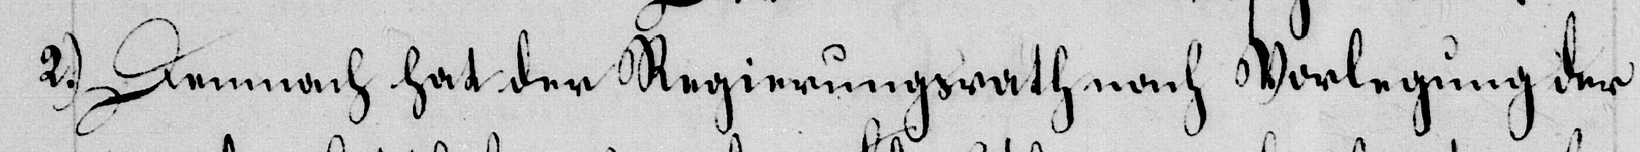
2.) Demnach hat der Regierungsrath nach Vorlegung der
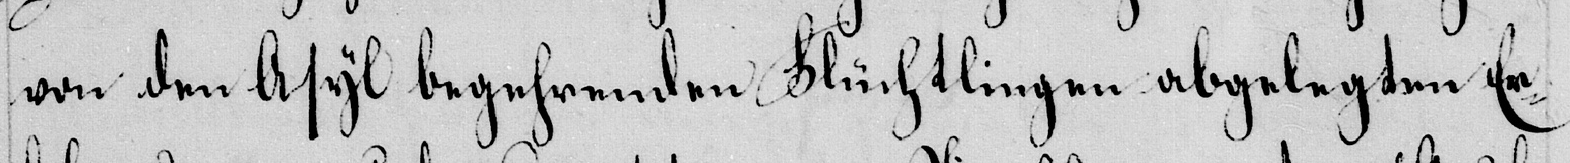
von den Asyl begehrenden Flüchtlingen abgelegten Er¬
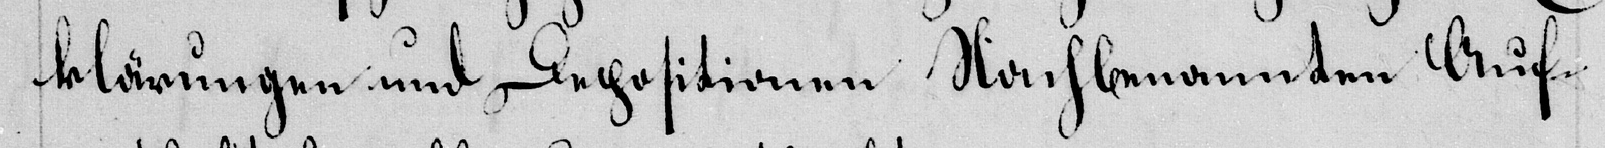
klärungen und Depositionen Nachbenannten Auf¬
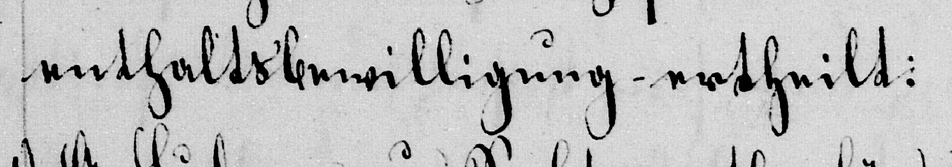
enthaltsbewilligungen ertheilt:
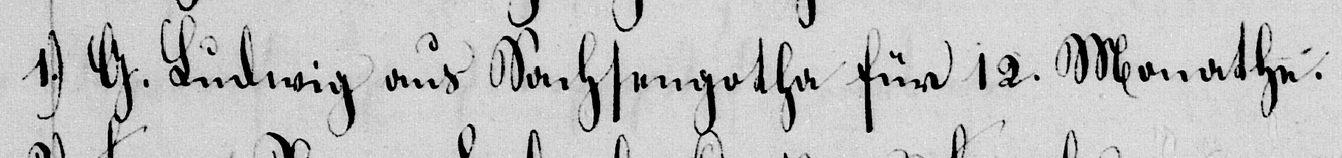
1.) G. Ludwig aus Sachsengotha für 12. Monathe.
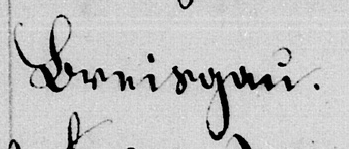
Breisgau.
